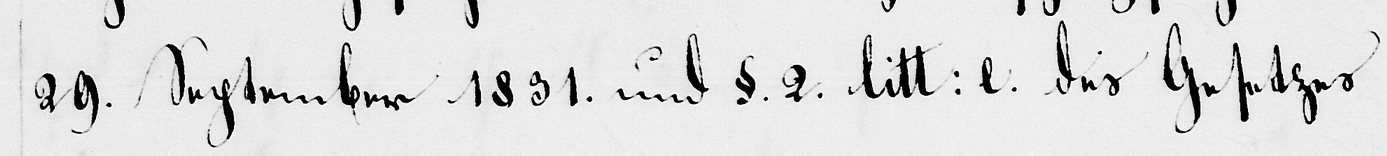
29. September 1831. und §. 2. litt: e. des Gesetzes
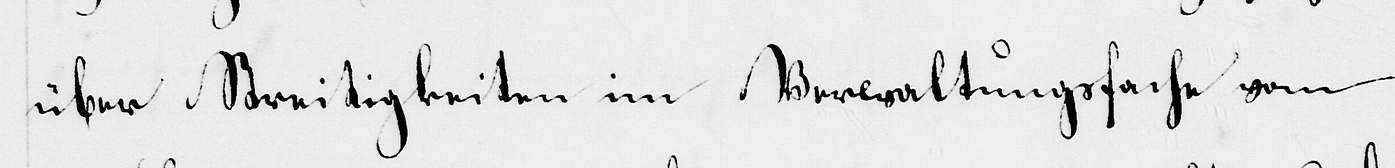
über Streitigkeiten im Verwaltungsfache vom
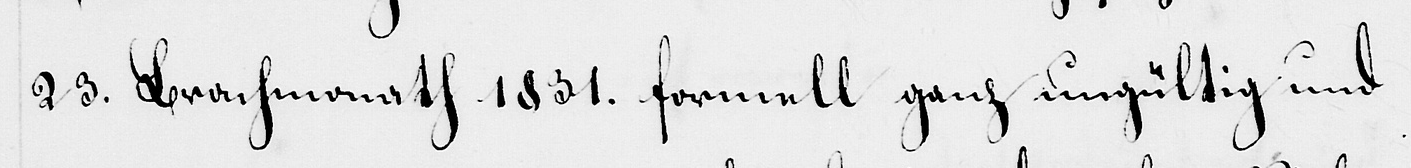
23. Brachmonath 1831. formell ganz ungültig und
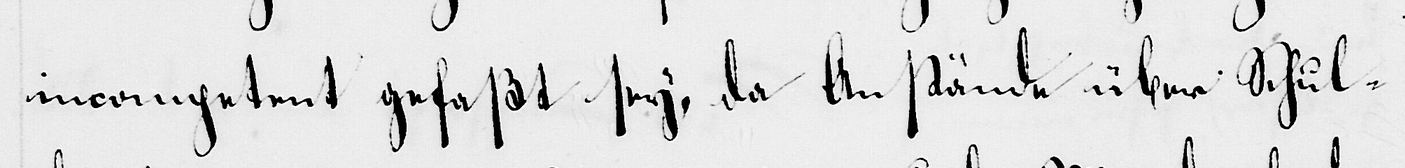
incopetent gefaßt sey, da Anstände über Schul¬
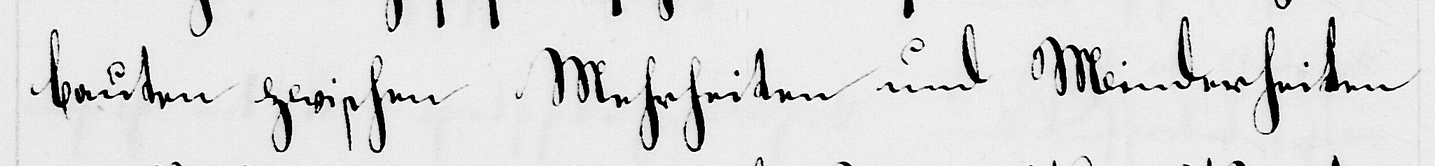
bauten zwischen Mehrheiten und Minderheiten
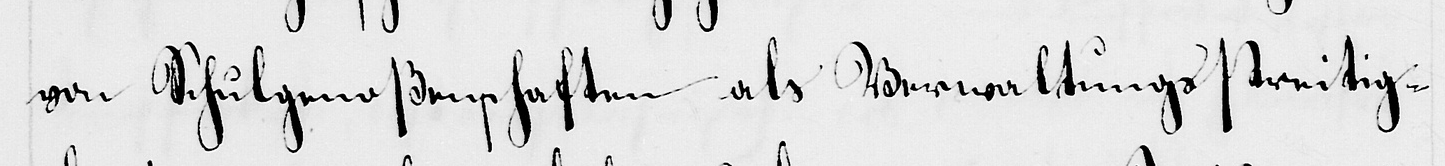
von Schulgenoßenschaften als Verwaltungsstreitig¬
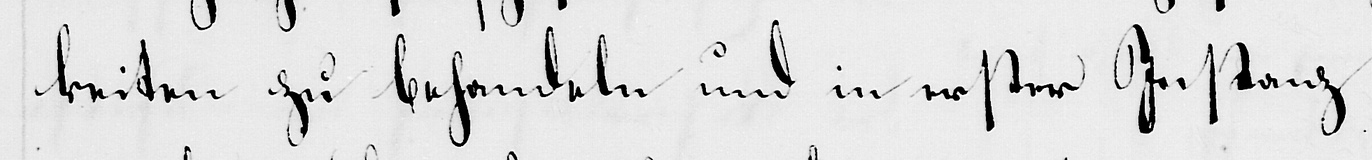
keiten zu behandeln und in erster Instanz
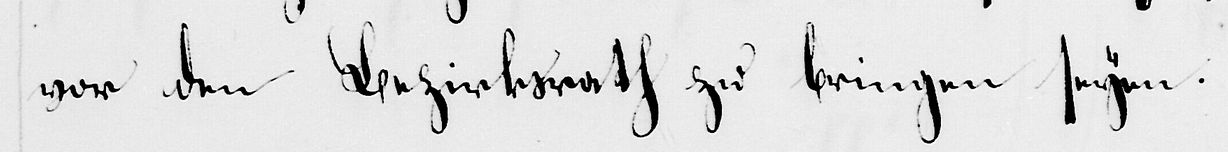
vor den Bezirksrath zu bringen seyen.
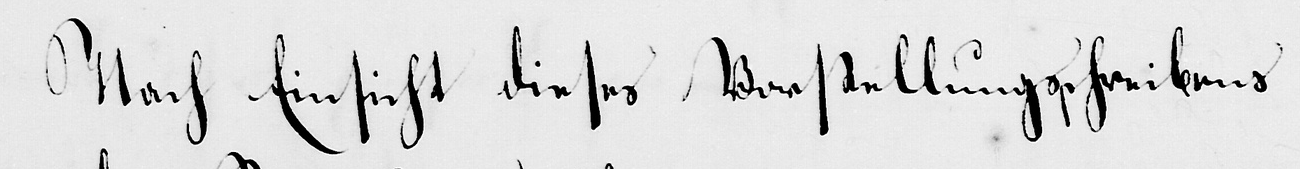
Nach Einsicht dieses Vorstellungsschreibens
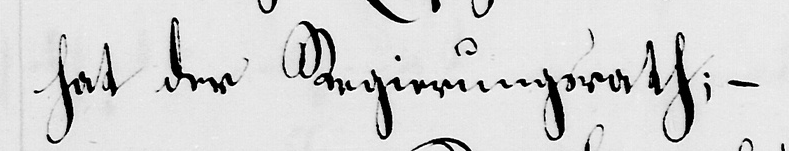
hat der Regierungsrath; –
